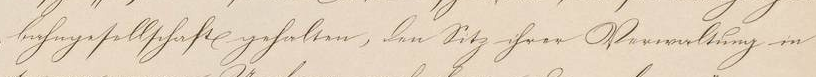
bahngesellschaft gehalten, den Sitz ihrer Verwaltung in
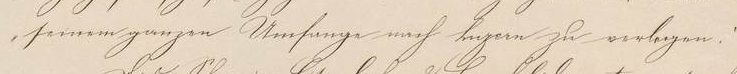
seinem ganzen Umfange nach Luzern zu verlegen.»
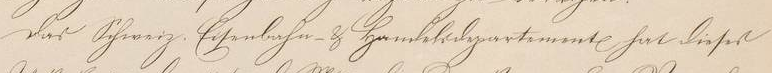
Das Schweiz. Eisenbahn- & Handelsdepartement hat dieses
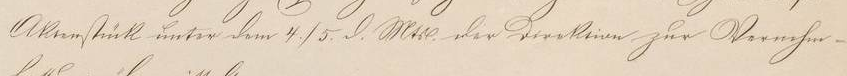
Aktenstück unter dem 4./5. d. Mts. der Direktion zur Vernehm-
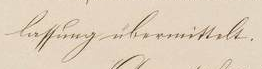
lassung übermittelt.
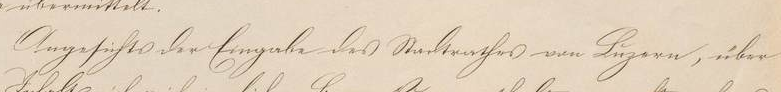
Angesichts der Eingabe des Stadtrathes von Luzern, über
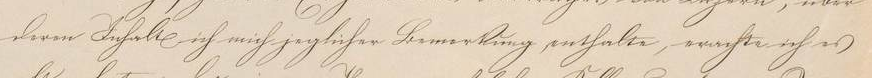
deren Inhalt ich mich jeglicher Bemerkung enthalte, erachte ich es
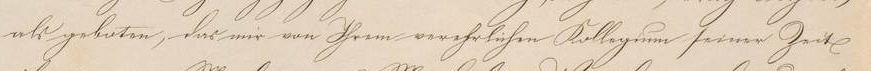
als geboten, das mir von Ihrem verehrlichen Kollegium seiner Zeit
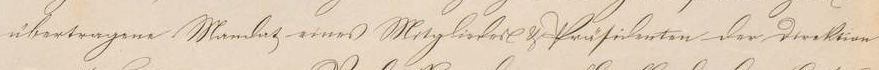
übertragene Mandat eines Mitgliedes & Präsidenten der Direktion
